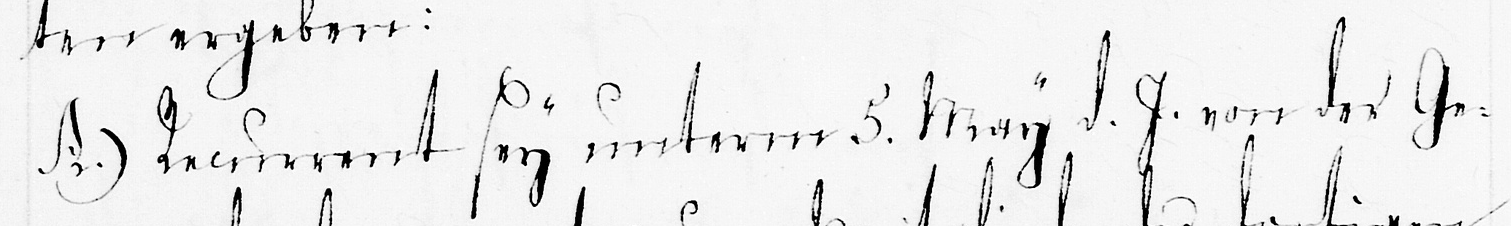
A.) Recurrent sey unterm 5. May d. J. von der Ge¬
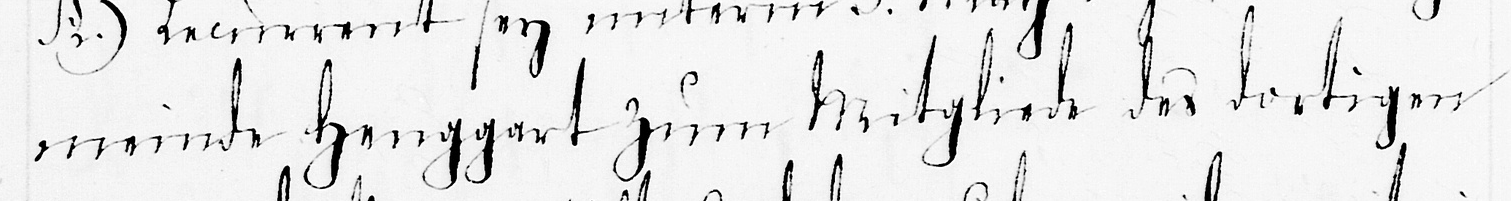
meinde Henggart zum Mitgliede des dortigen
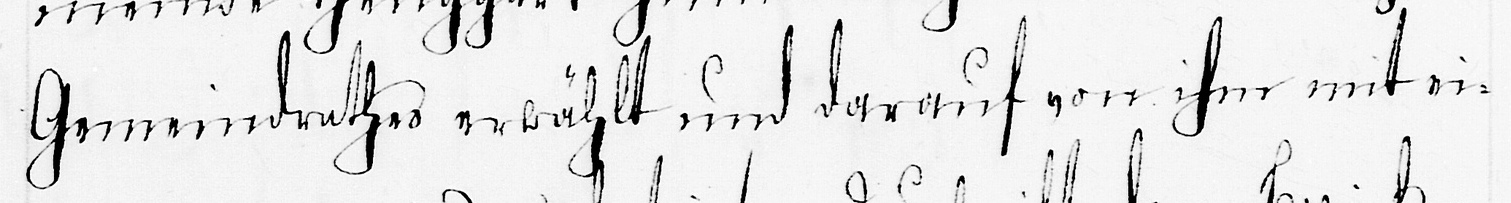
Gemeindrathes erwählt und darauf von ihm mit ei¬
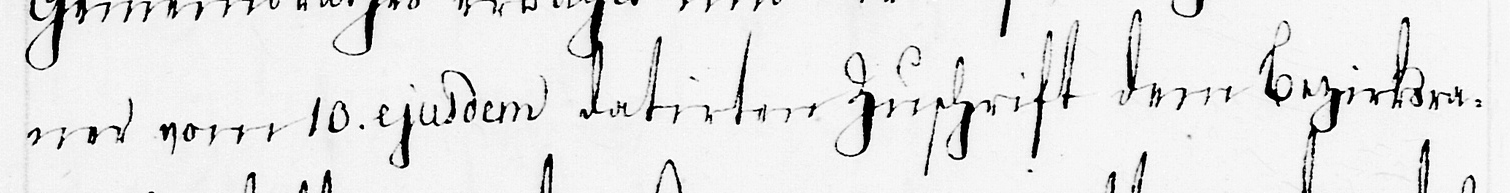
ner vom 10. ejusdem datirten Zuschrift dem Bezirksra¬
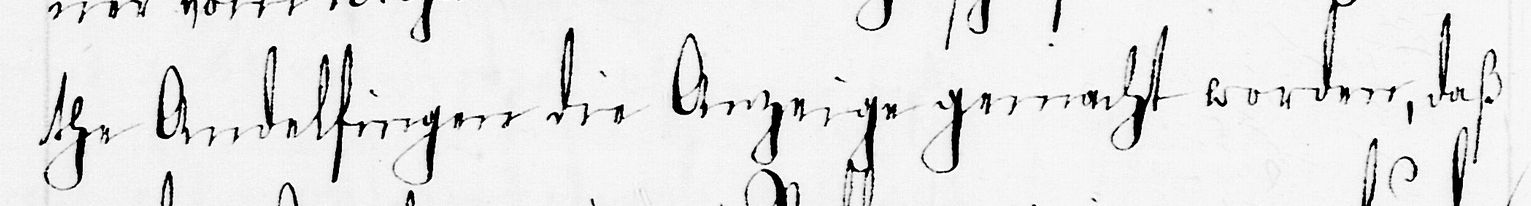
the Andelfingen die Anzeige gemacht worden, daß
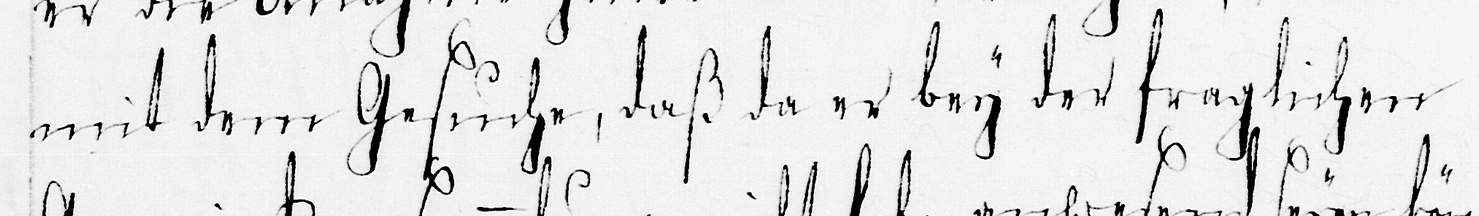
mit dem Gesuche, daß da er bey der fraglichen
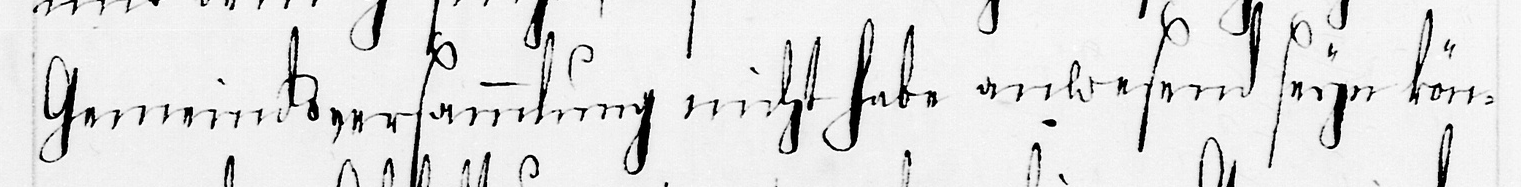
Gemeindsversammlung nicht habe anwesend seyn kön¬
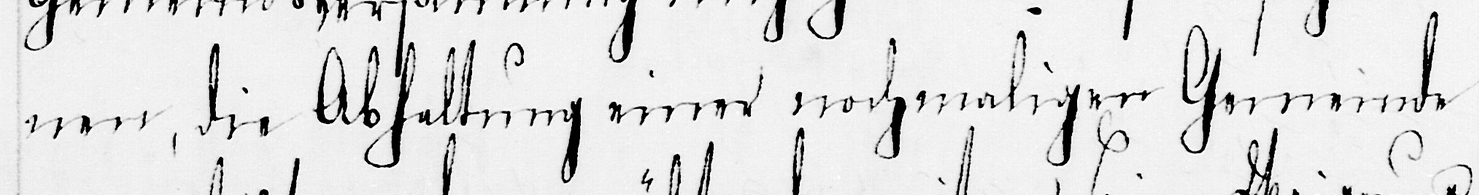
nen, die Abhaltung einer nochmaligen Gemeinde
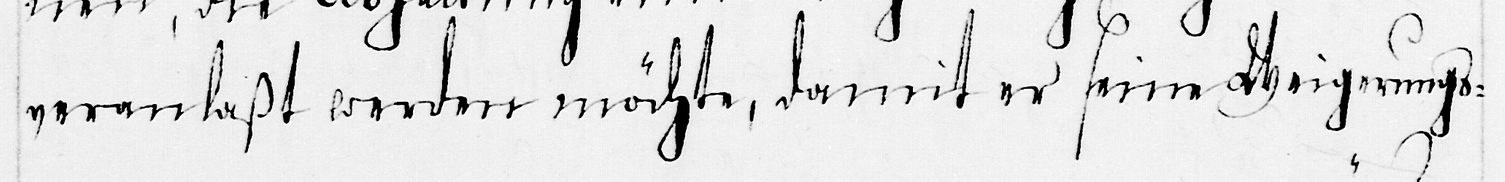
veranlaßt werden möchte, damit er seine Weigerungs-
